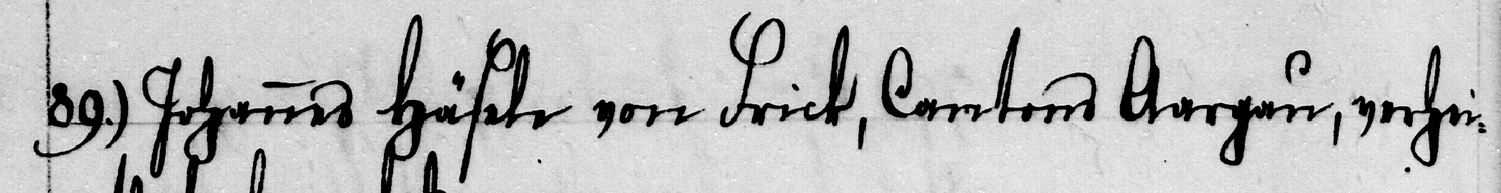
89.) Johannes Häfele von Frick, Cantons Aargau, verhei¬
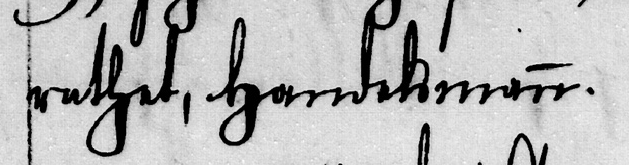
rathet, Handelsmann.
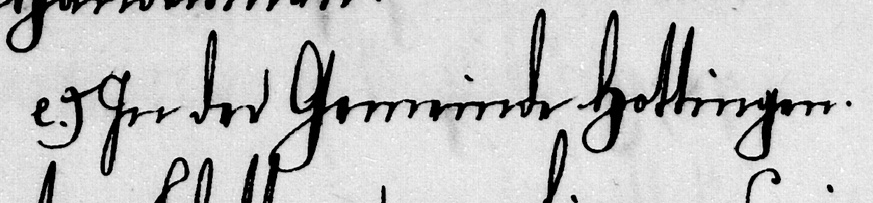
e.) In der Gemeinde Hottingen.
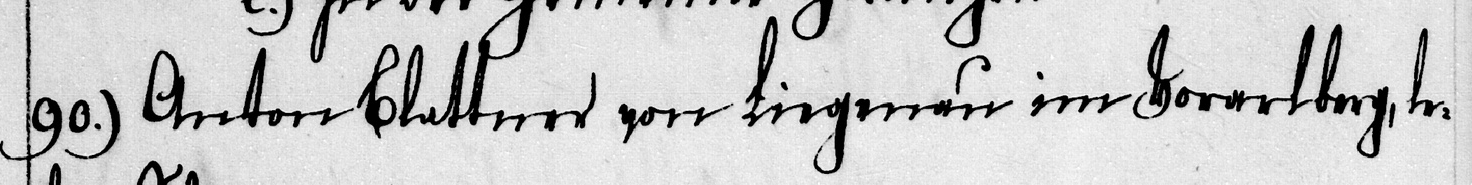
90.) Anton Blattner von Liegenau im Vorarlberg, le¬
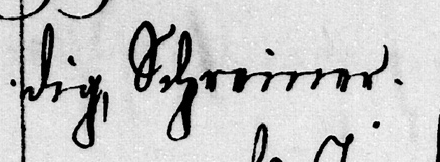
dig, Schreiner.
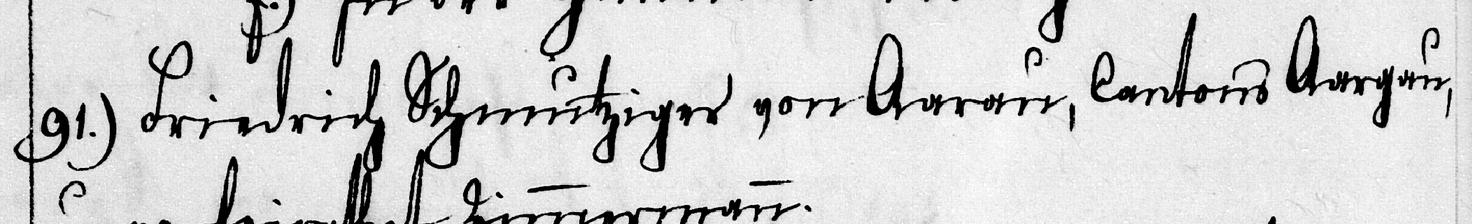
91.) Friedrich Schmutziger von Aarau, Cantons Aargau,
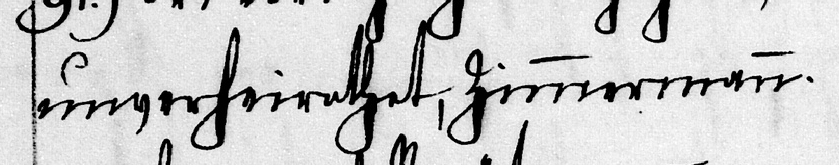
unverheirathet, Zimmermann.
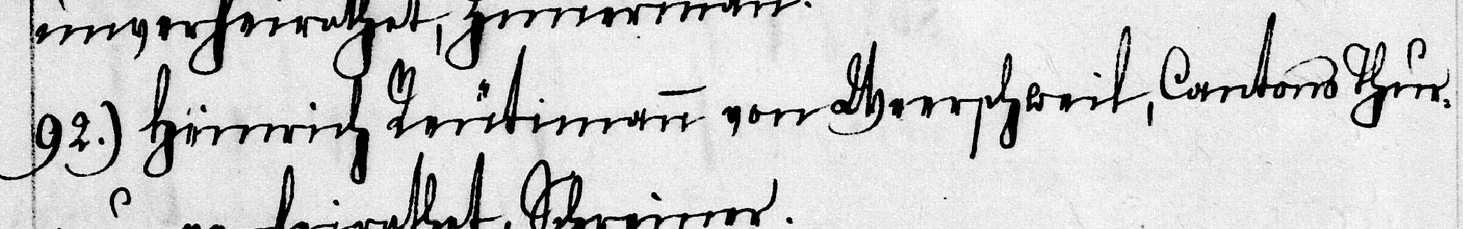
92.) Heinrich Reutimann von Weerschweil, Cantons Thur¬
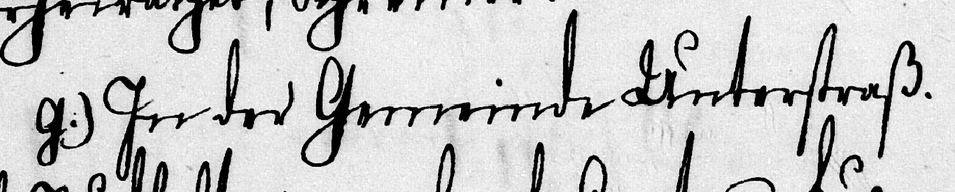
g.) In der Gemeinde Unterstraß.
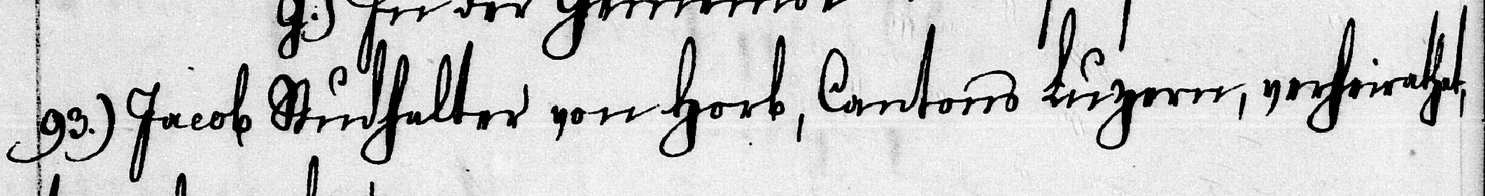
93.) Jacob Studhalter von Horb, Cantons Luzern, verheirath¬
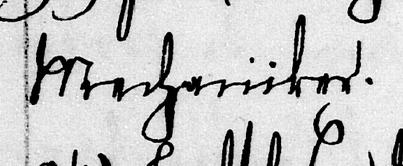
Mechaniker.
